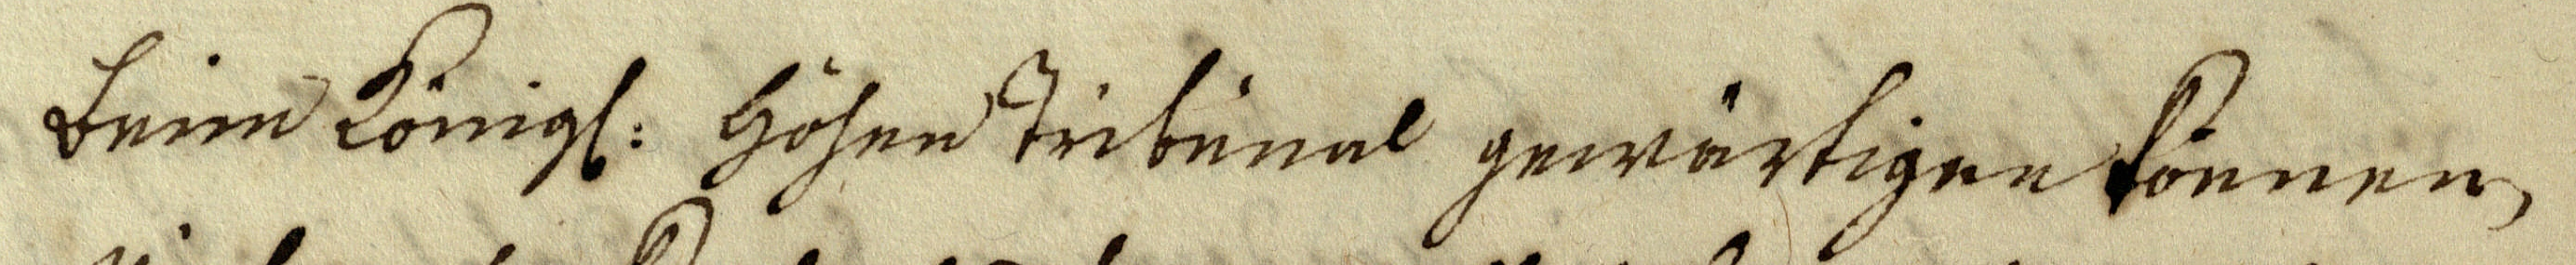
beim Königl Hohen Tribunal gewärtigen können,
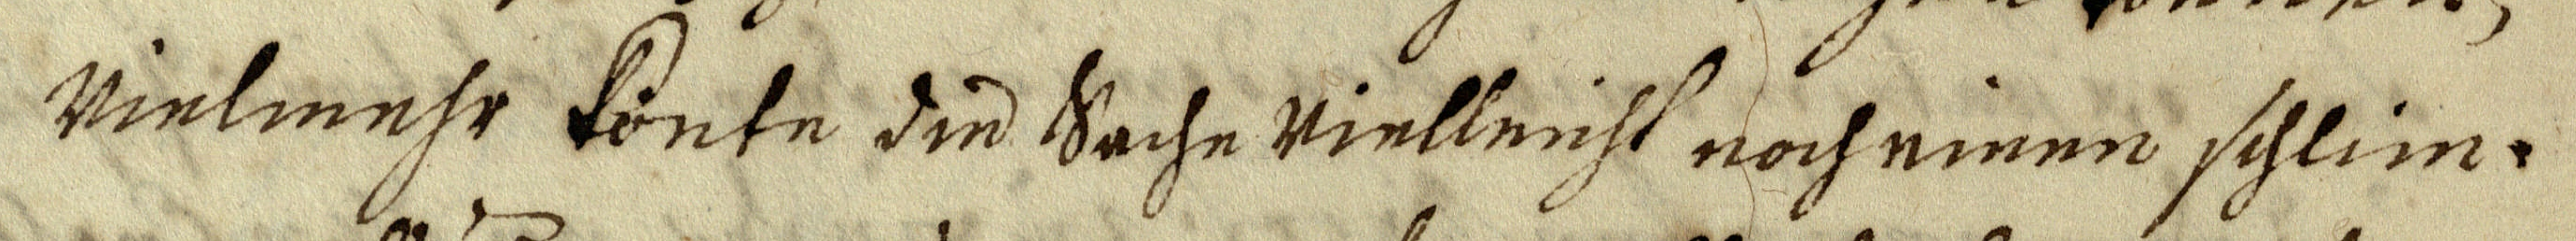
vielmehr könte die Sache vielleicht noch einen schlim¬
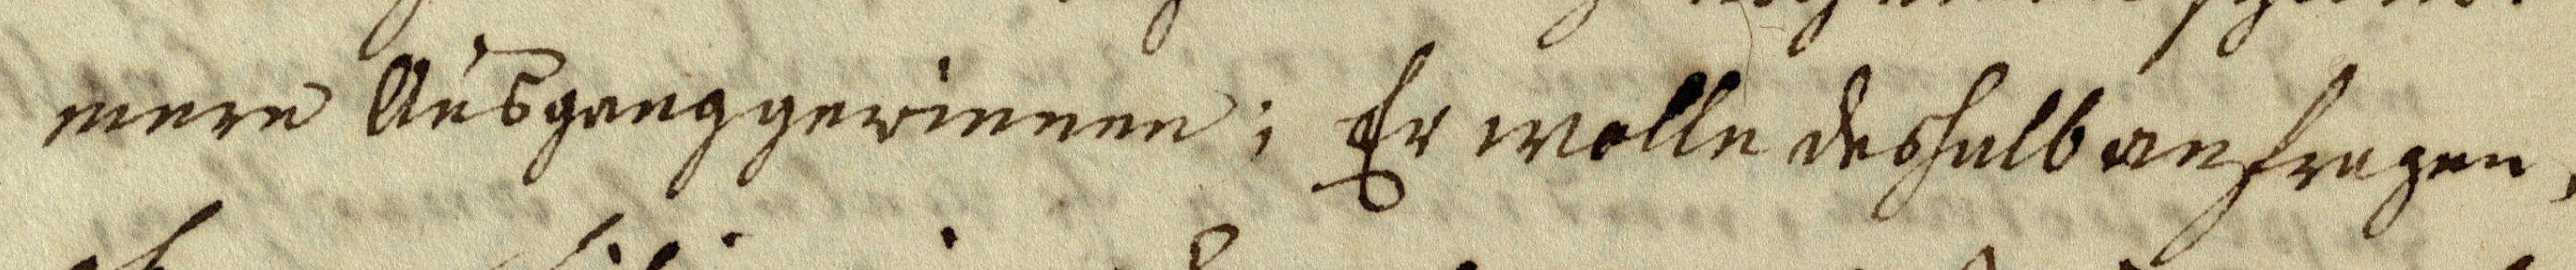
mern Ausgang gewinnen; Er wolle deshalb anfragen,
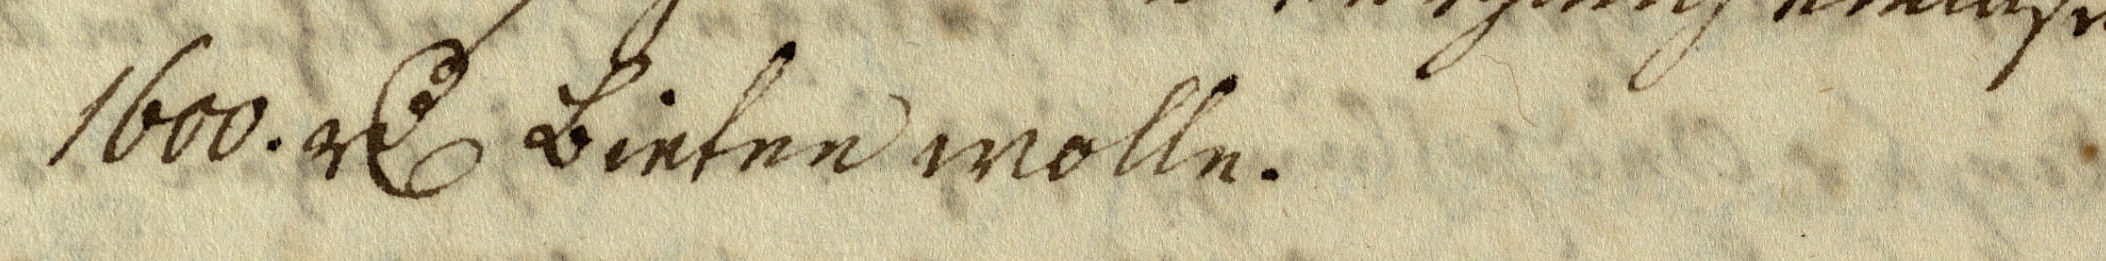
ob man sich in einen Vergleich einlaßen und 15. bis
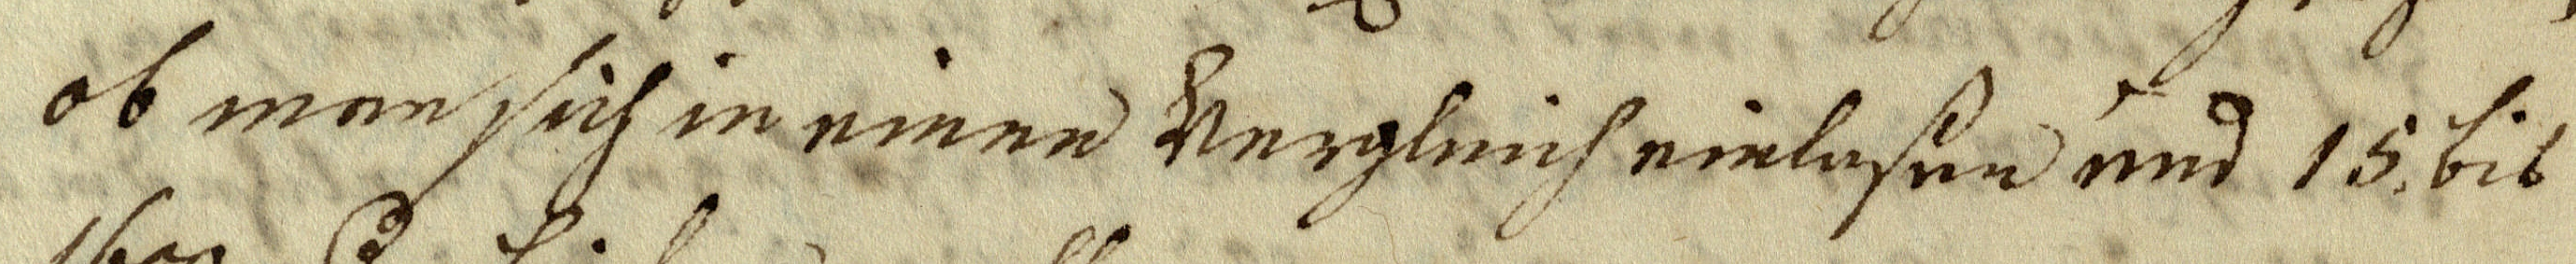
1600. r. bieten wolle.
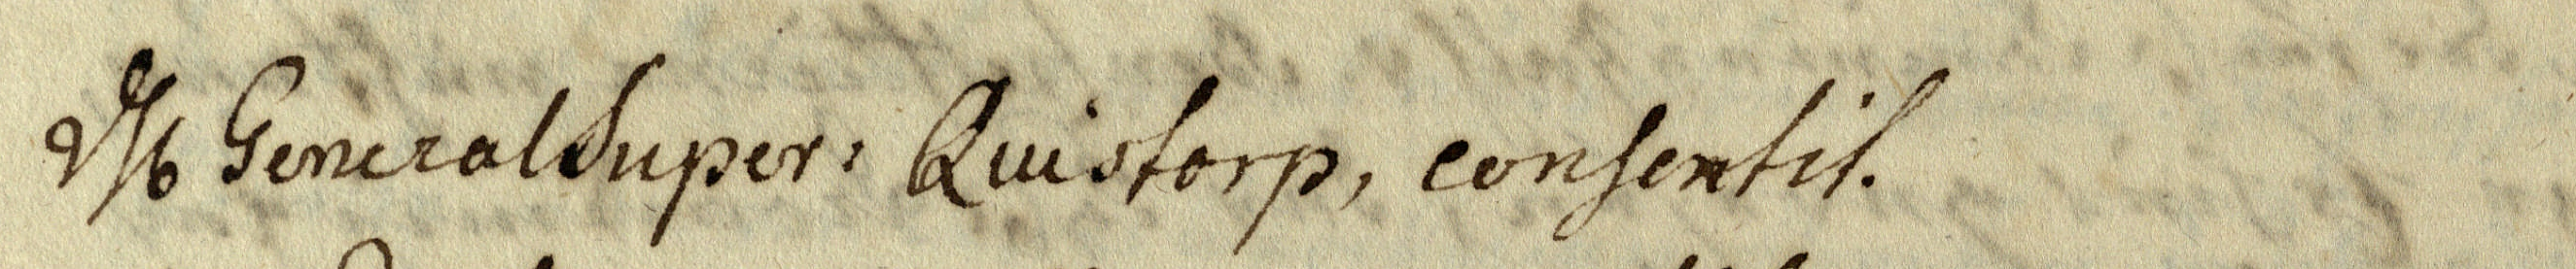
dh GeneralSuper. Quistorp, consentit.
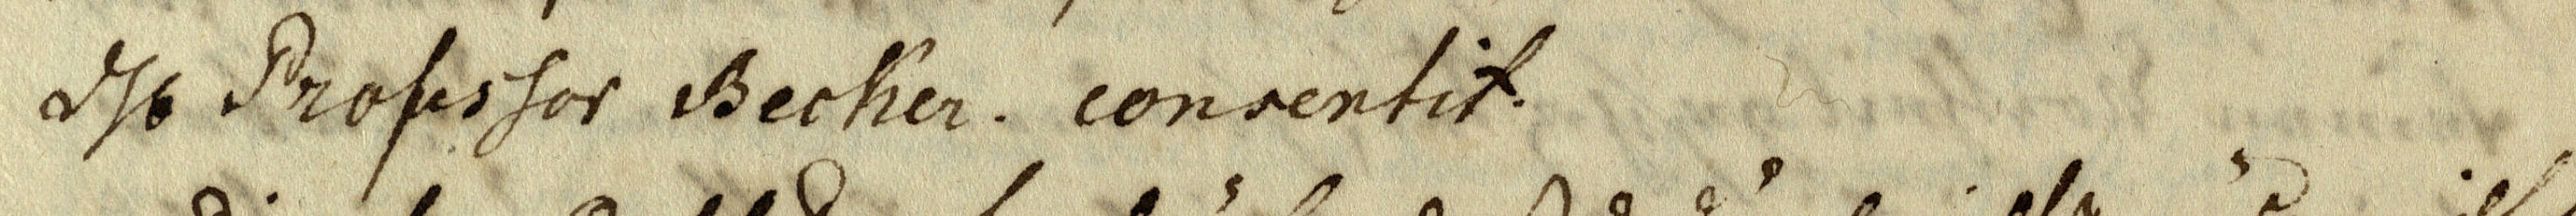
dh. Professor Becker. consentit.
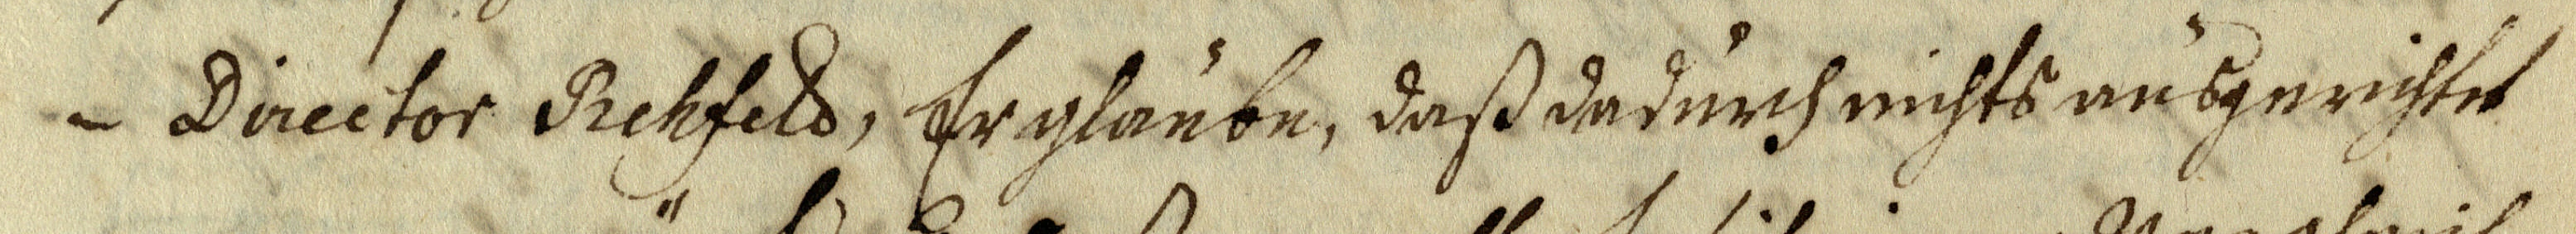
Director Rehfeld. Er glaube, daß dadurch nichts ausgerichtet
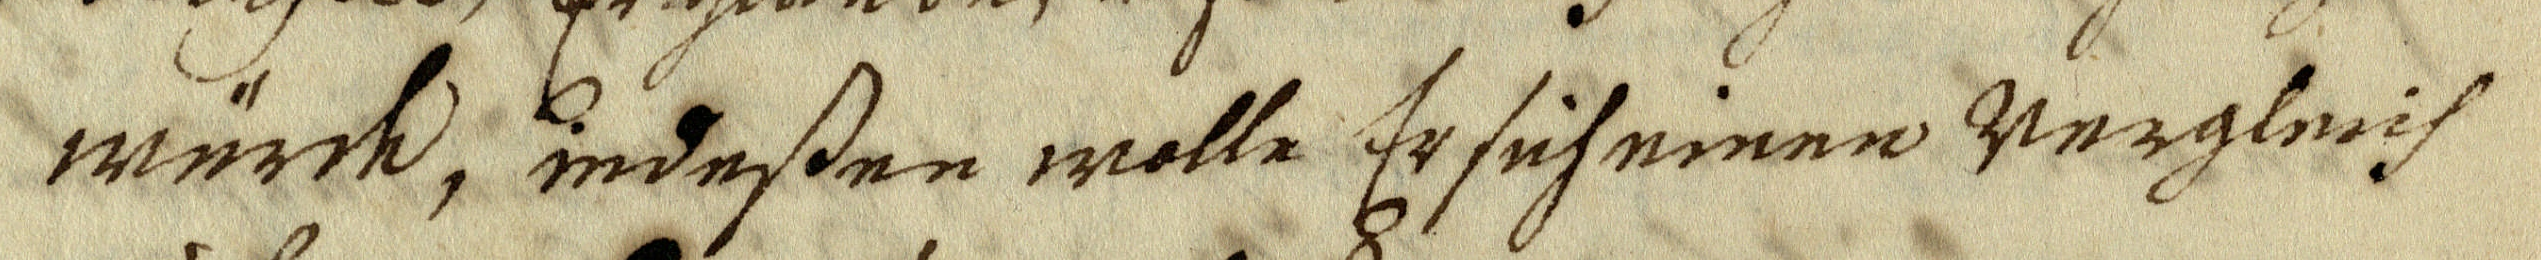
würde, indeßen wolle Er sich einen Vergleich
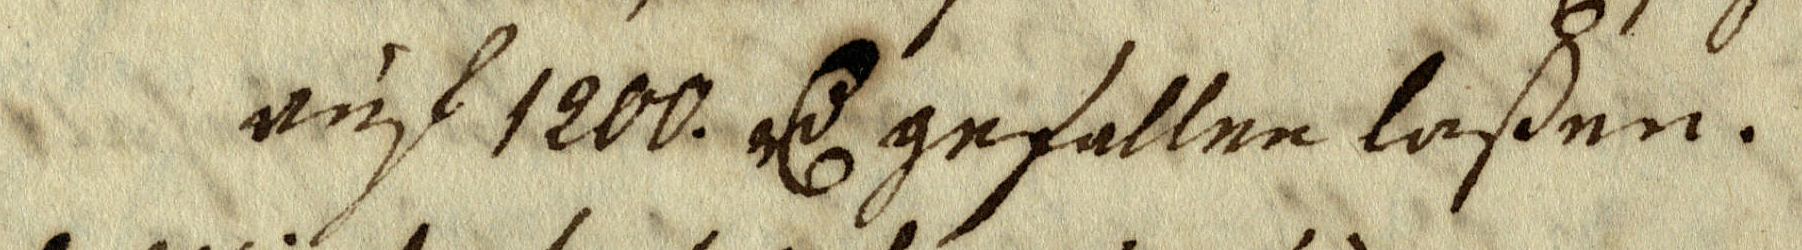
auf 1200 r. gefallen laßen.
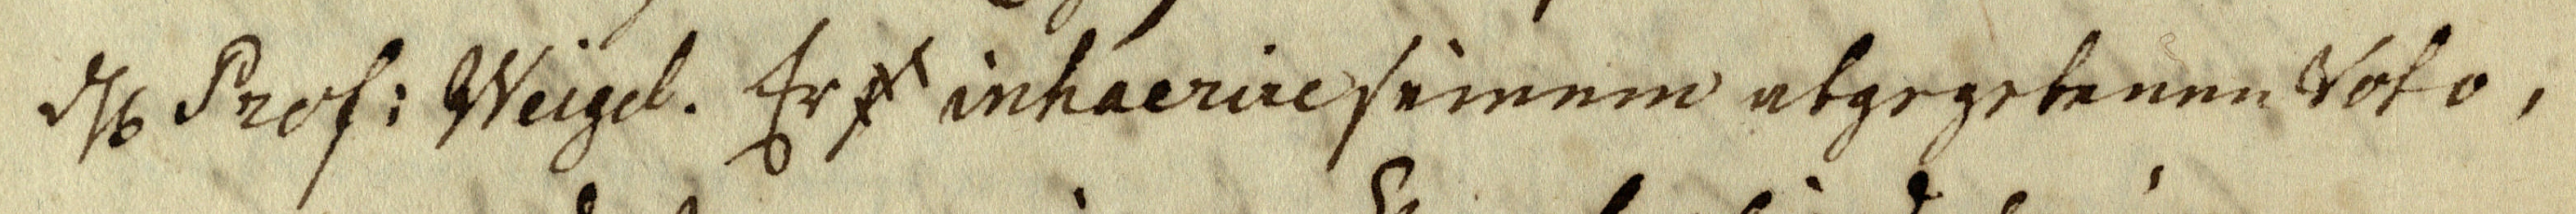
dh Prof. Weigel. Er inhaerire seinem abgegebenen Voto,
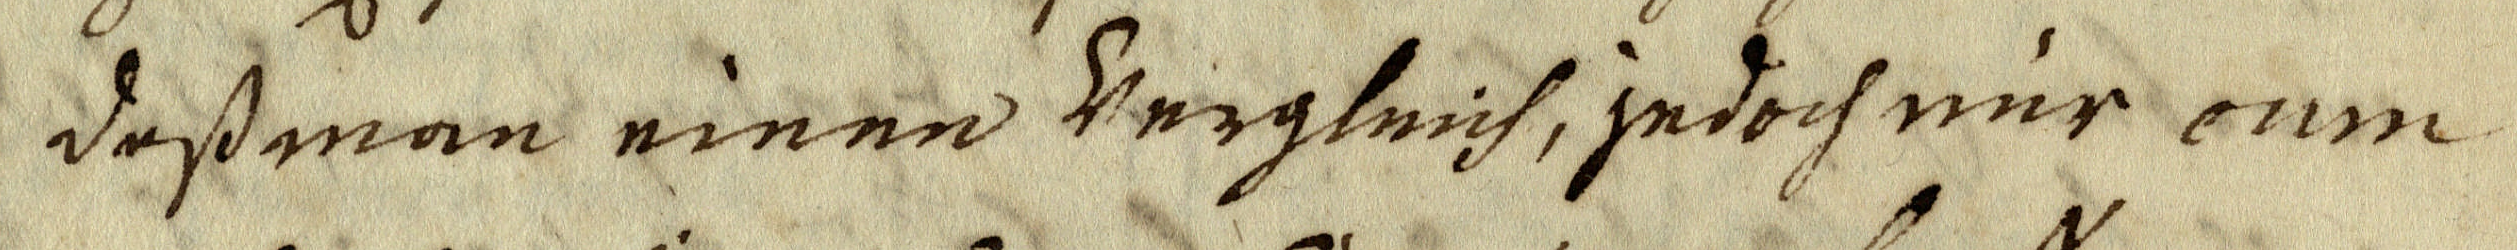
daß man einen Vergleich, jedoch nur cum
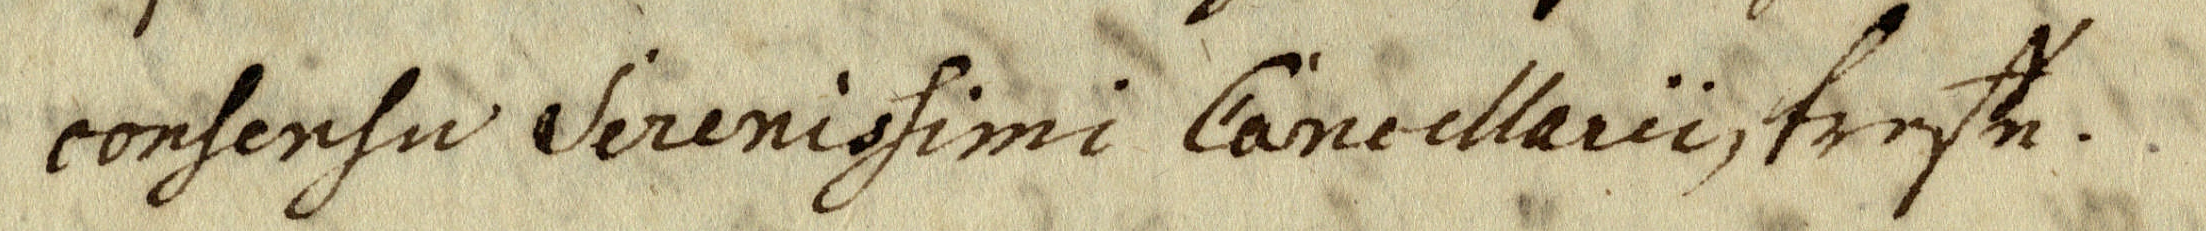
consensu Serenissimi Cancellarii, treffe.
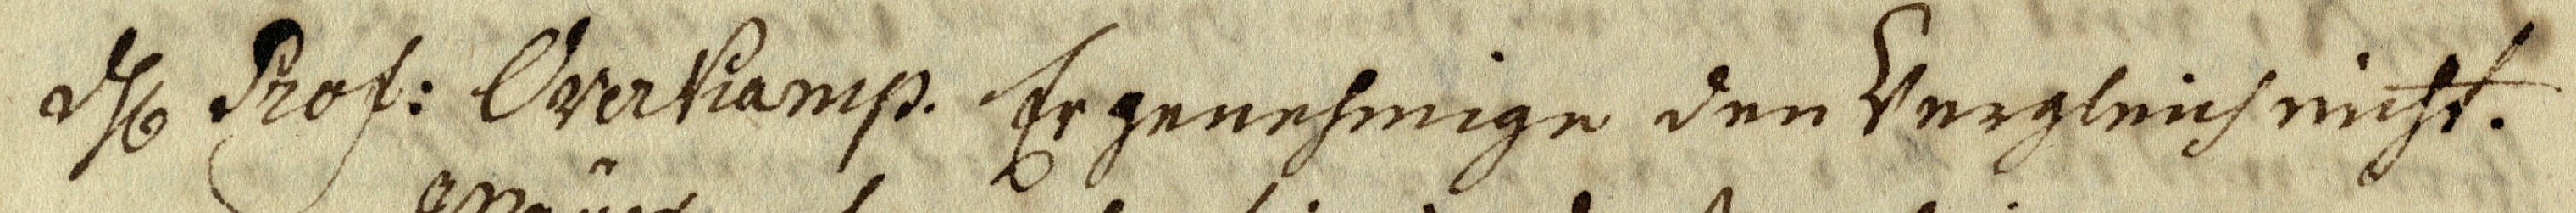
dh Prof. Overkamp. Er genehmige den Vergleich nicht.
